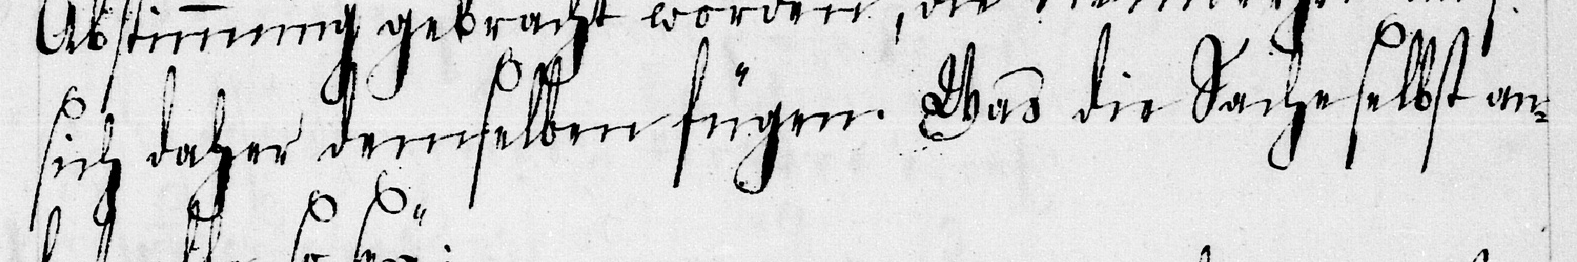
sich daher demselben fügen. Was die Sache selbst an¬
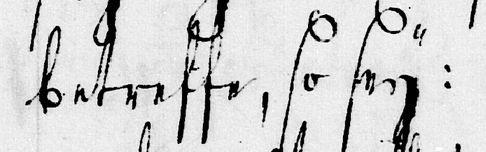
betreffe, so sey:
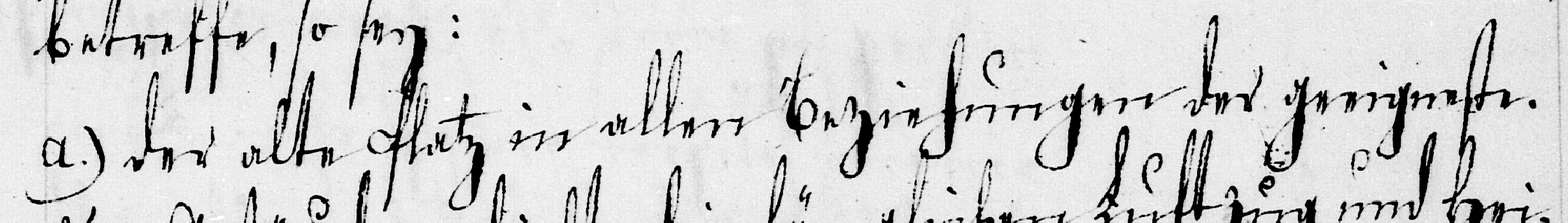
a.) der alte Platz in allen Beziehungen der geeigneste.
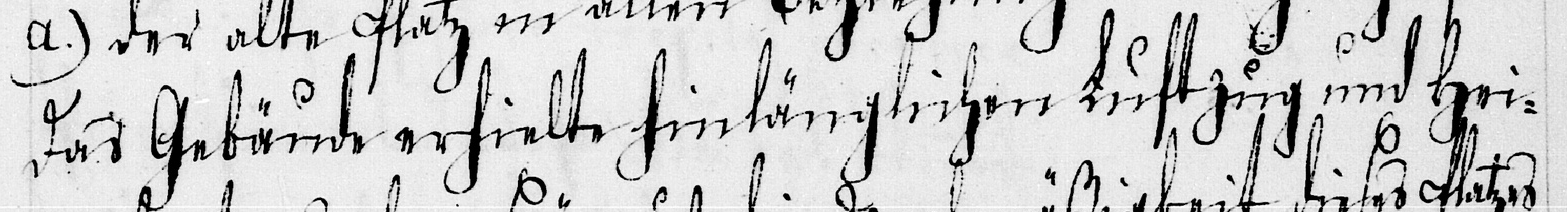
Das Gebäude erhielte hinlänglichen Luftzug und Hei¬
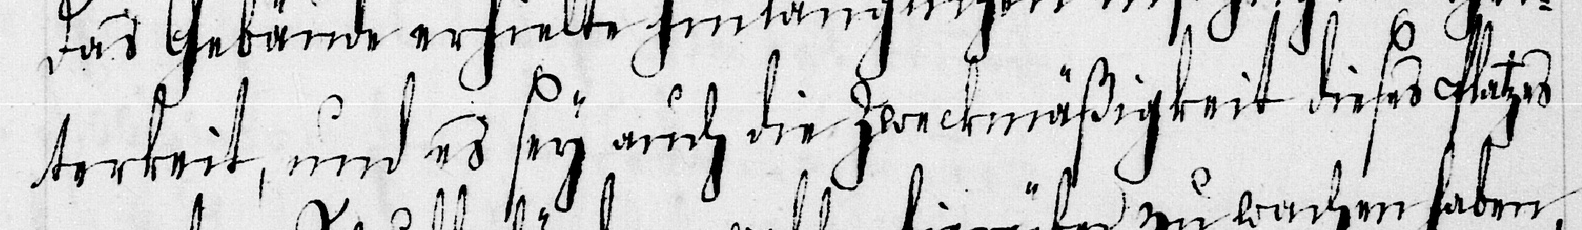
terkeit, und es sey auch die Zweckmäßigkeit dieses Platzes
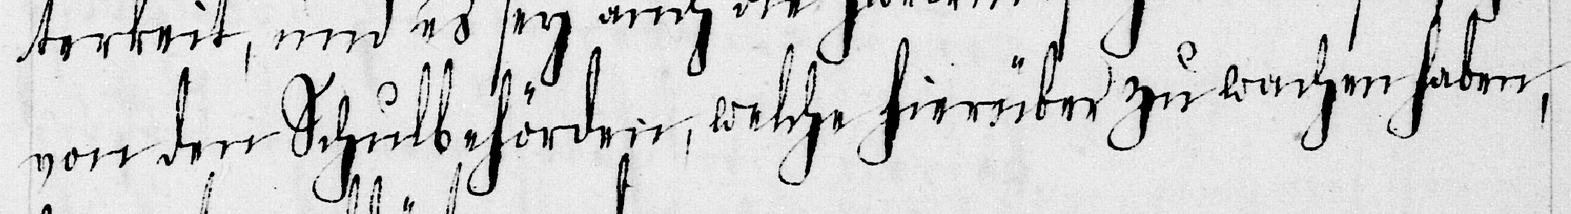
von den Schulbehörden, welche hierüber zu wachen haben,
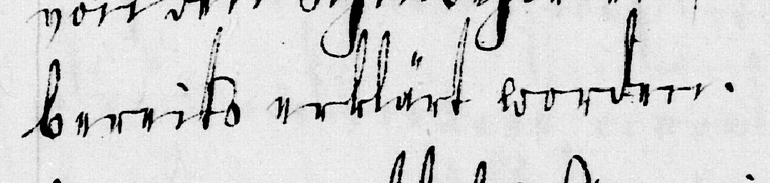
bereits erklärt worden.
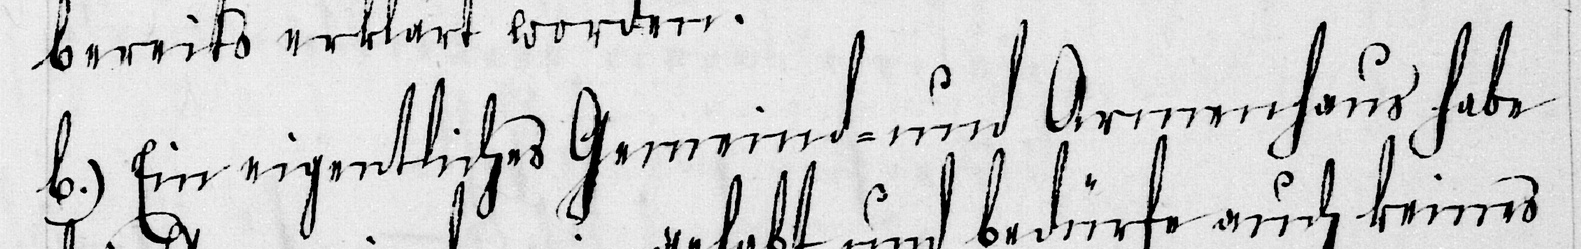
b.) Ein eigentliches Gemeind- und Armenhaus habe
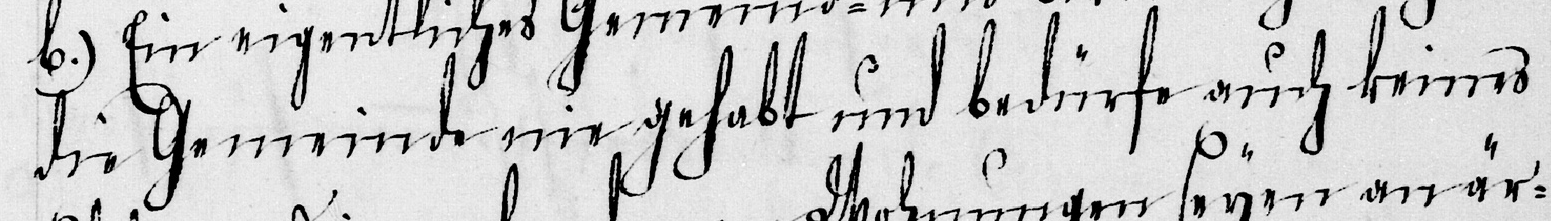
die Gemeinde nie gehabt und bedürfe auch keines
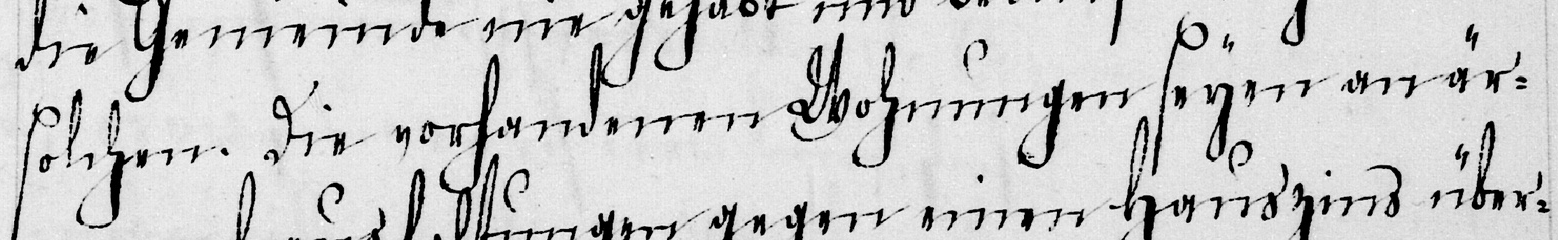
solchen. Die vorhandenen Wohnungen seyen an är¬
